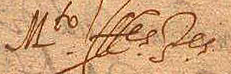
Mto. Jl̄les. sres.
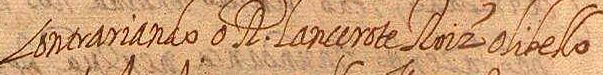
contrariando o R. Lancerote Roiz̄ o libello
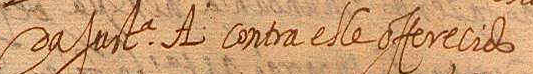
da Justa. A contra elle offerecido
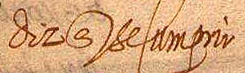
diz q̄ se Cumprir
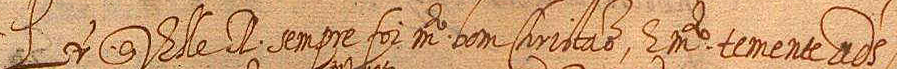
Porq̄ Elle R. sempre foi mto. bom Christão, E mto. temente a ds̄
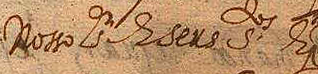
nosso sor E seus S.tos E
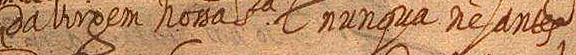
da virgem nossa sra. E nunqua nē antes
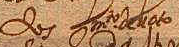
mto. deuoto
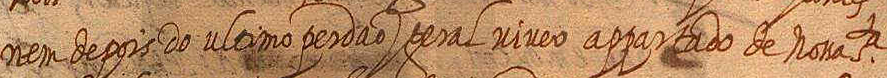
nem depois do ultimo perdão geral uiueo appartado de nossa sta.
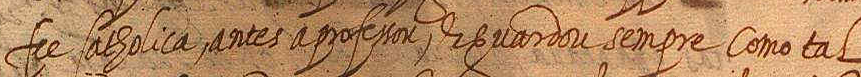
fee Catholica, antes a professou, E guardou sempre como taL
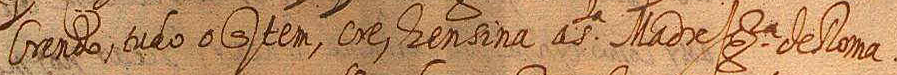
Crendo, tudo o q̄ tem, cre, E ensina a sta. Madre Jgra. de Roma
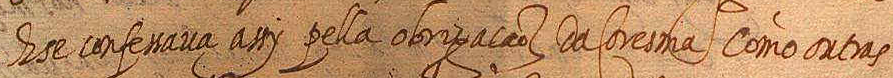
E se confessaua assy pella obrigação da Coresma como outras
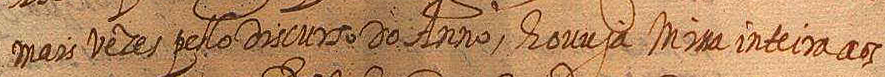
mais vezes pello discurso do Anno, E ouuja missa inteira aos
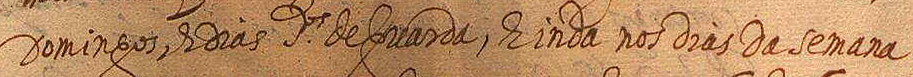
Domingos, E dias stos. de Guarda, E inda nos dias da semana
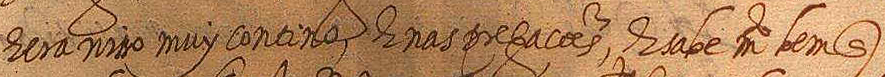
E era nisso muy contino, E nas pregações, E sabe mto bem q̄
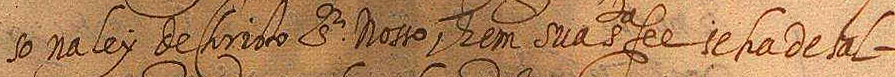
so na ley de Christo sor. nosso, E em sua sta fee se hade saL
